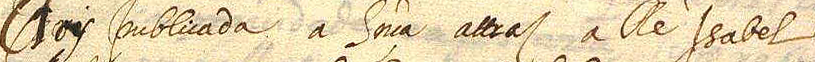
Foy publicada a Snç̄a attraz a Re Jsabel
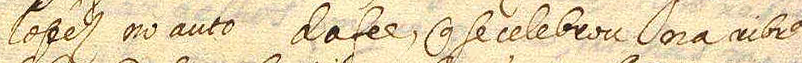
lopez no auto da fee, q̄ se celebrou na ribra
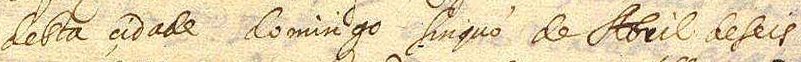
desta cidade domingo sinquo de Abril de seis
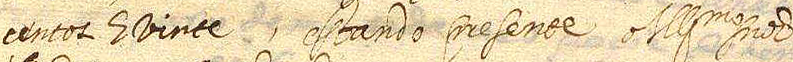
centos E vinte, estando presente o Ills.mo snor̄
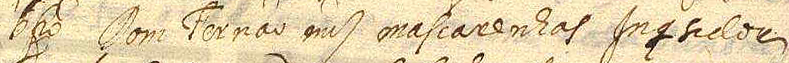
bp̄o Dom Fernão mīz mascarenhas Inꝗsidor
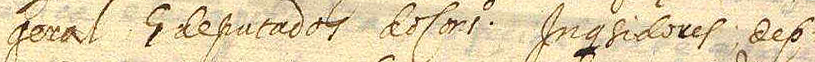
geral E deputados do Cons.o Jnquisidores; dep
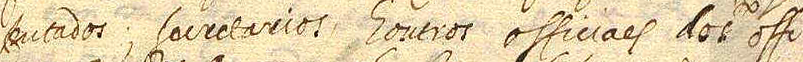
putados; secretarios, E outros officiaes do sto offi
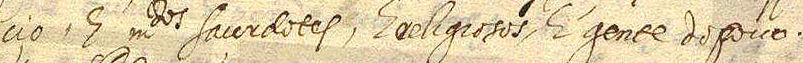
cio, E mtos sacerdotes, E religiosos, E gente do pouo
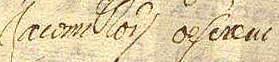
Jacome Roīz o escreui
